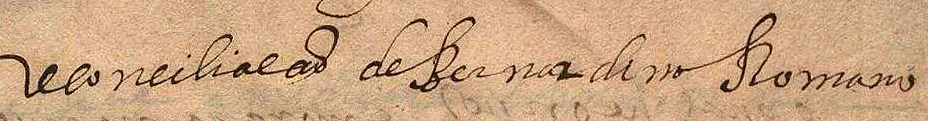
reconciliaçaõ de Bernardino Romano
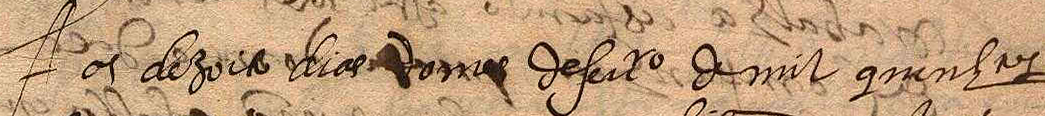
Aos dezoito dias do mes de feuro de mil quinhtos
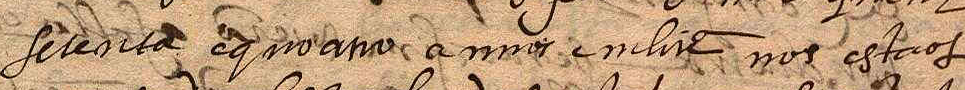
setenta e quoatro annos em lixa nos estaos
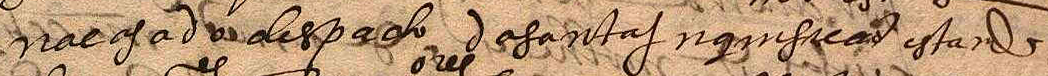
na casa do despacho da santa Jnquisiçaõ estando
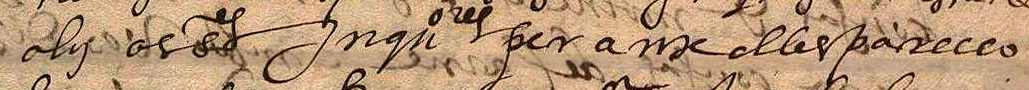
ahj os sres Jnquores perante elles pareceo
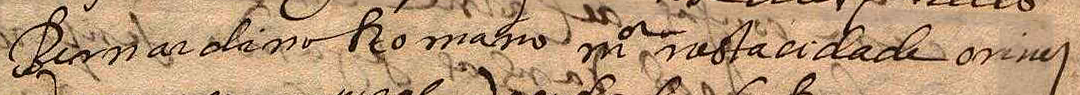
Bernardino Romano mor nesta cidade oriues
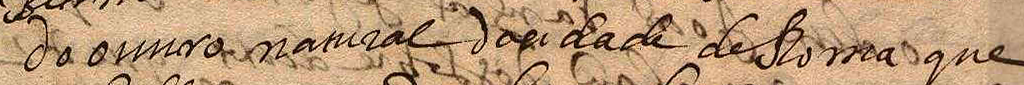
do ouuro natural da cidade de Roma que
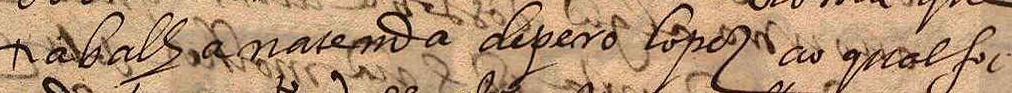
trabalha na temda de pero lopez ao qual foi
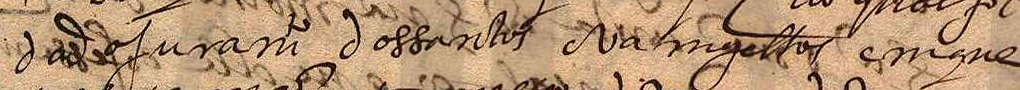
dado Juramto dos santos evamgelhos em que
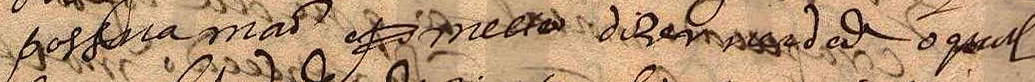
pos sua maõ e ꝓomeetteo dizer uerdade o quaL
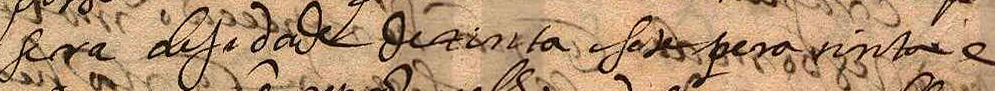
sera de Jdade de tinta e sete pera tinta e
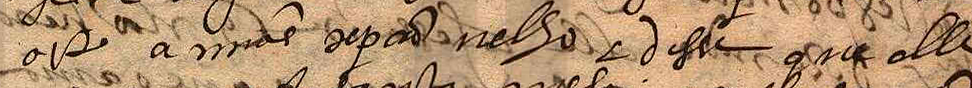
ojto annōs xpaõ uelho E disse que elle
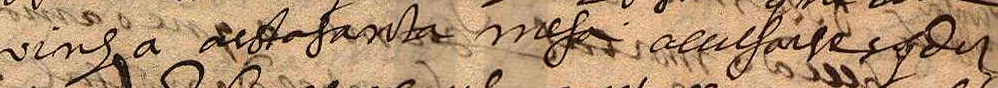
vinha a esta santa mesa accusarse E pedir
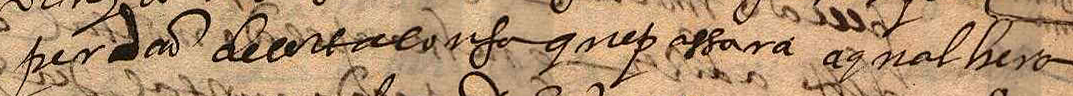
perdaõ de certa cousa que passara a qual hera
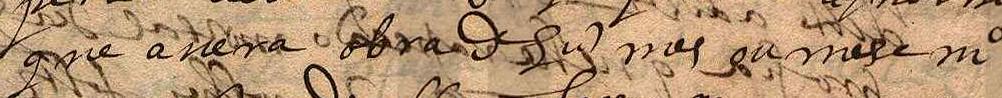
que auera obra de hū mes ou mes e mo
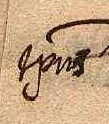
tpūs
